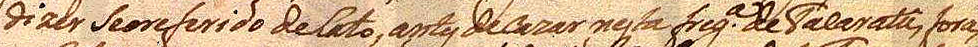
dizer se o referido deLato, antes de cazar nesta freg.a de Tacaratú, fora
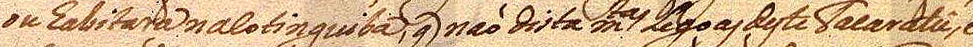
ou habitara na Contiguiba, q̄ naõ dista mtas Legoas deste Tacaratú, e
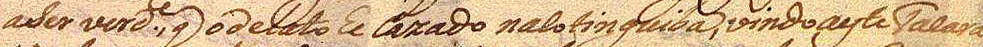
a Ser verd.e. q̄ o deLato he cazado na Contiguiba, vindo a este Tacara
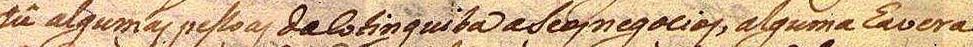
tú algumas pessoas da Continguiba a Seos negocios, alguma havera
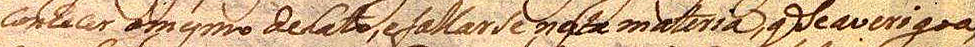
conhecer o mesmo deLato, e fallarse nesta materia, q̄ Se averigoa,
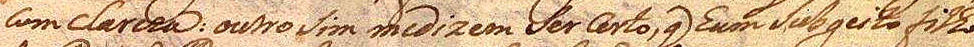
com cLareza: outrosim me dizem Ser certo, q̄ hum Subgeito filho
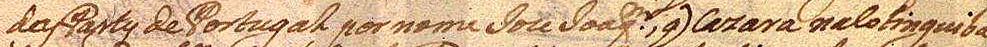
das Partes de Portugal por nome Ioze Ioaq.m, q̄ cazara na Continguiba
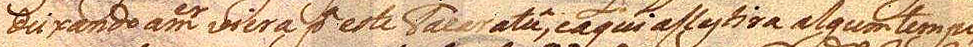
deixando a mer viera pa este Tacaratú, e aqui assestira algum tempo,
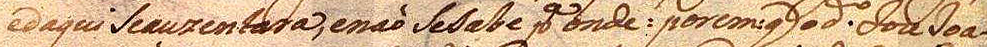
e daqui se auzentara, e naõ se Sabe pa onde: porem: q̄ o d.o Ioze Ioa
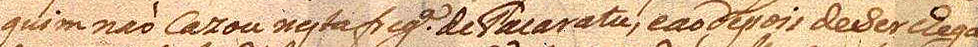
quim naõ Cazou nesta freg.a de Tacaratú, e ao depois de Ser chega
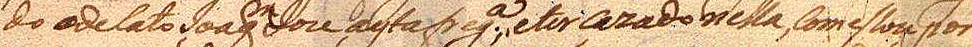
do o delato Ioaqm Ioze a esta freg.a, e ter cazado nella, comessou por
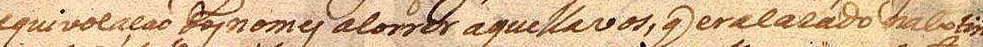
equivocaçaõ dos nomes a correr aquella vos, q̄ era cazado na cotin
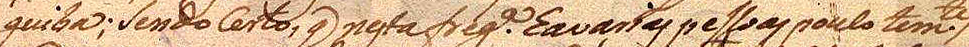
guiba; sendo Certo, q̄ nesta freg.a ha varias pessoas pouco tem.tes
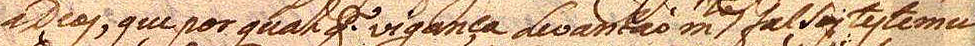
a Deos, que por quaLq̄r vingança Levantaõ mtos falsos testemu
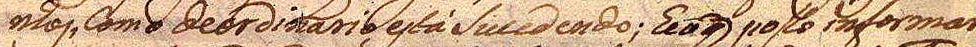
nhos, Como de ordinario está Sucedendo; he o q̄ posso informar
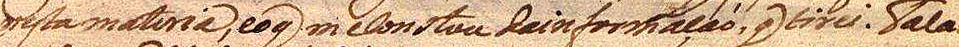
nesta materia, e o q̄ me constou de informaçaõ, q̄ tirei. Taca
